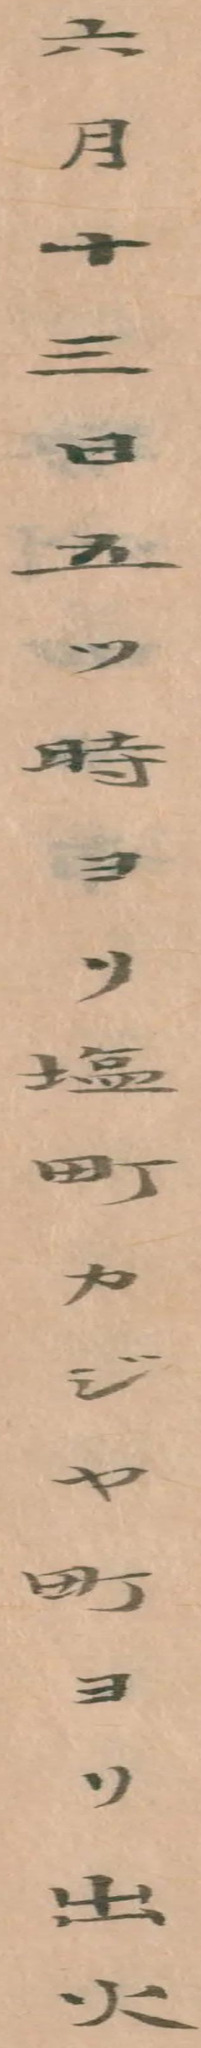六月十三日五ッ時ヨリ塩町カジヤ町ヨリ出火
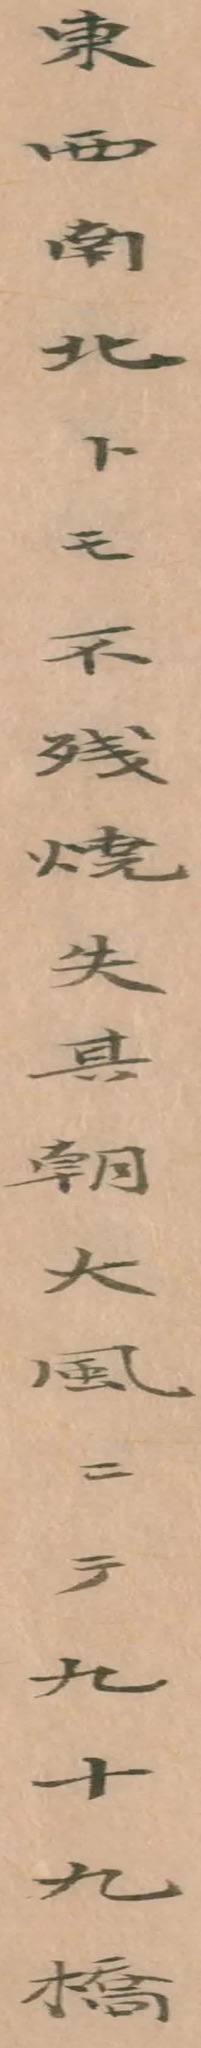東西南北トモ不残焼失其朝大風ニテ九十九橋
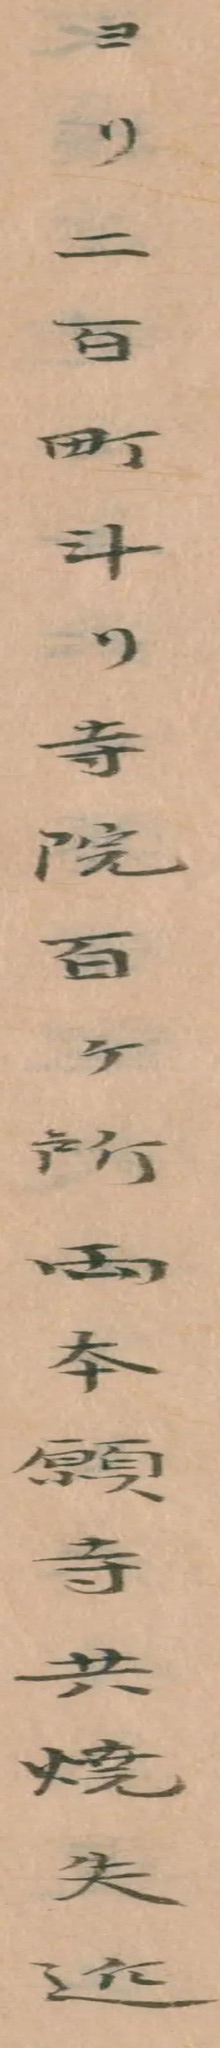ヨリ二百町斗り寺院百ヶ所両本願寺共焼失近
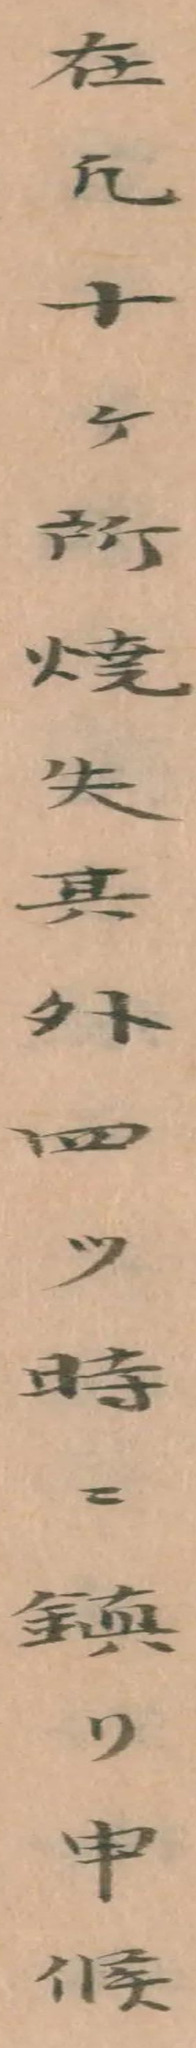在凡十ヶ所焼失其外四ツ時ニ鎮り申候
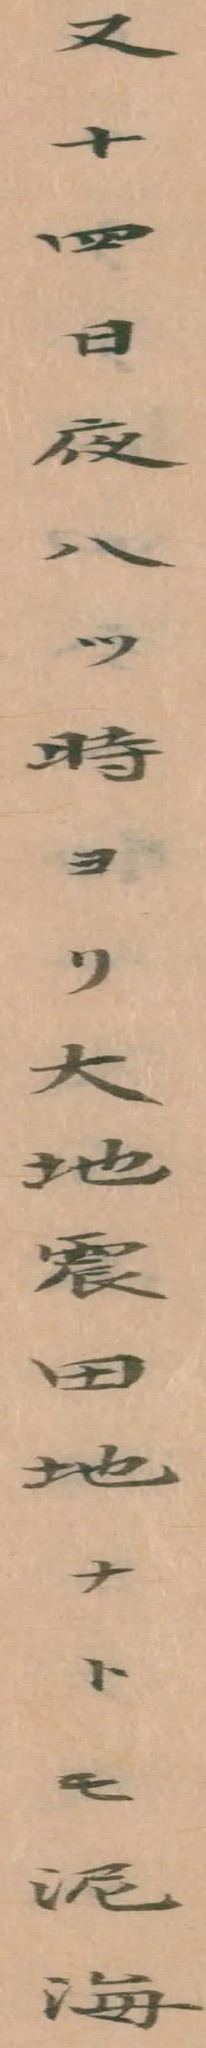又十四日夜八ッ時ヨリ大地震田地ナトモ泥海
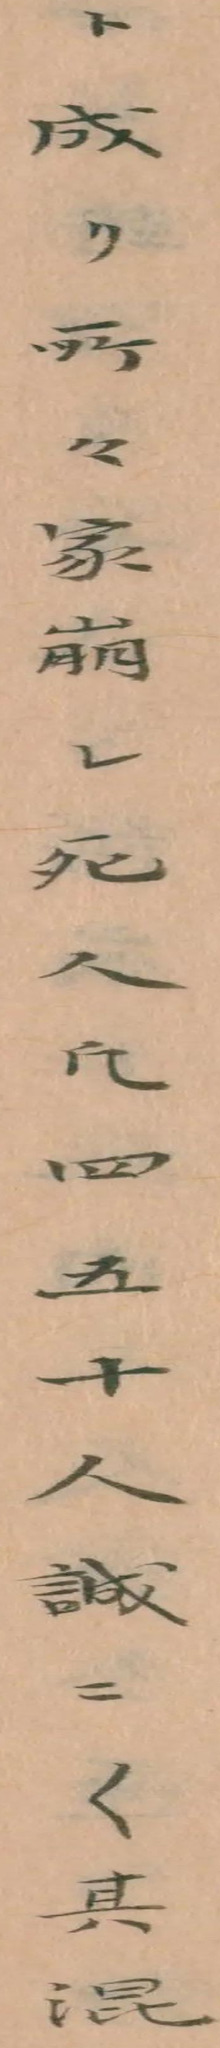ト成り所々家崩レ死人凡四五十人誠ニ〳〵其混
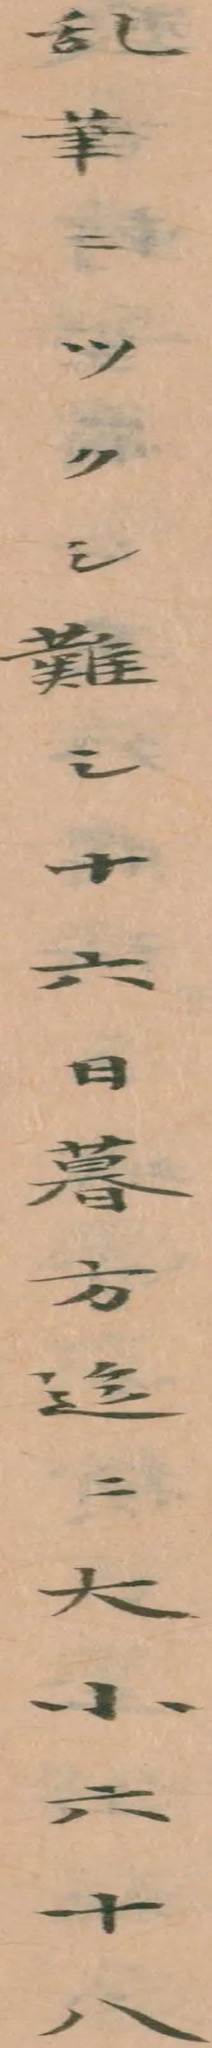乱筆ニツクシ難シ十六日暮方迄ニ大小六十八
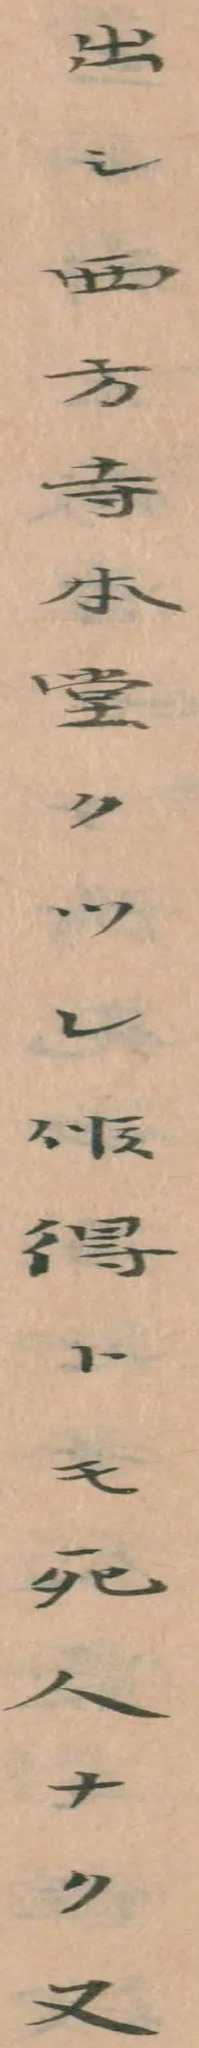出シ西方寺本堂クツレ候得トモ死人ナク又
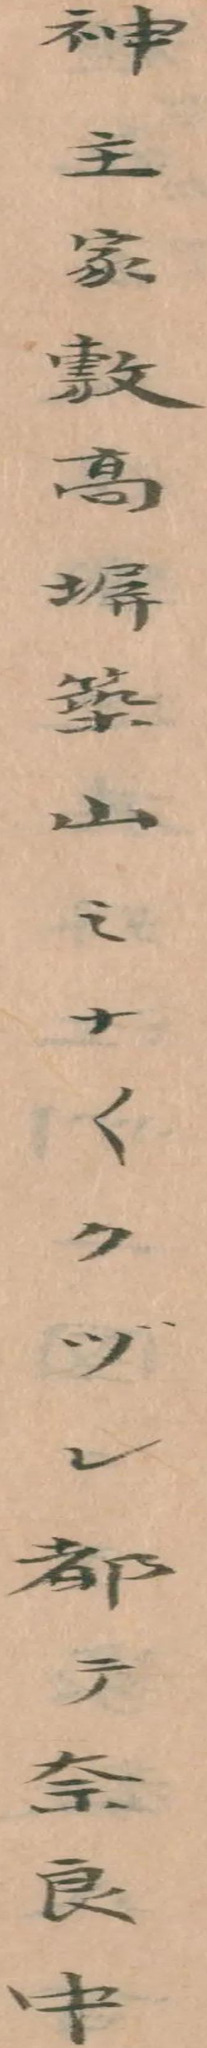神主家数高平築山ミナ〳〵クツレ都テ奈良中
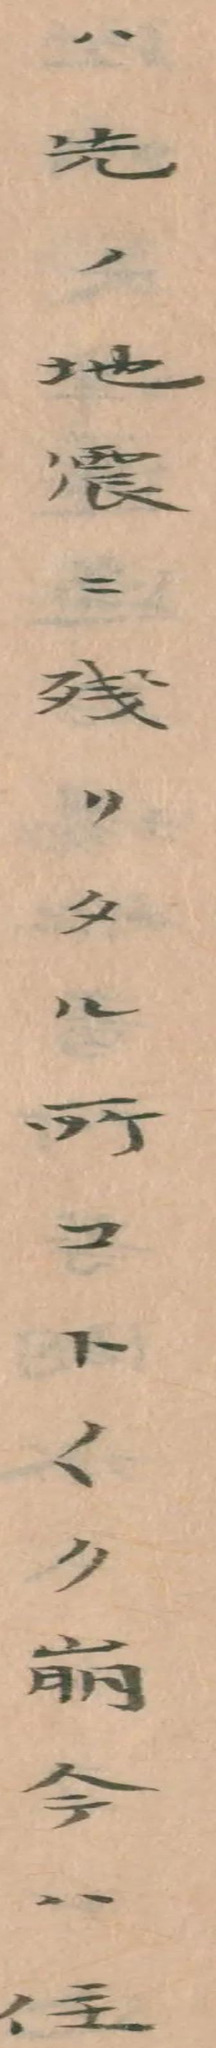ハ先ノ地震二残りタル所コト〳〵ク崩今ハ住
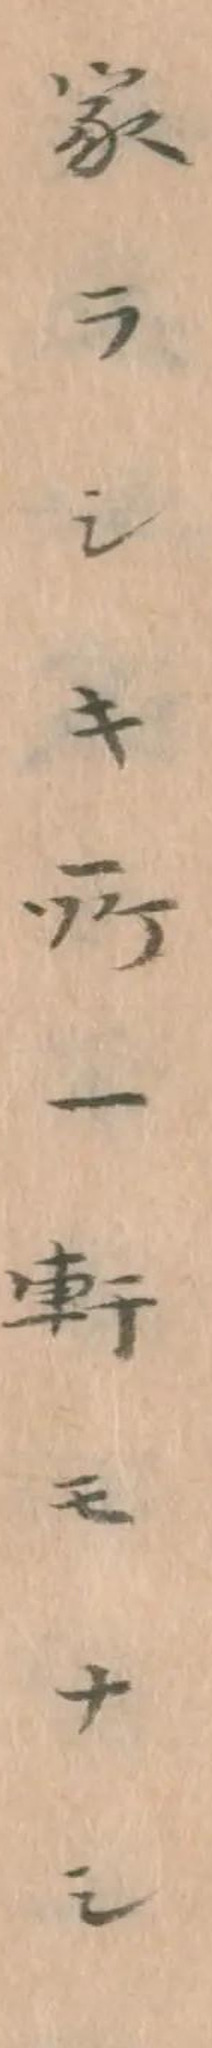家ラシキ所一軒モナシ
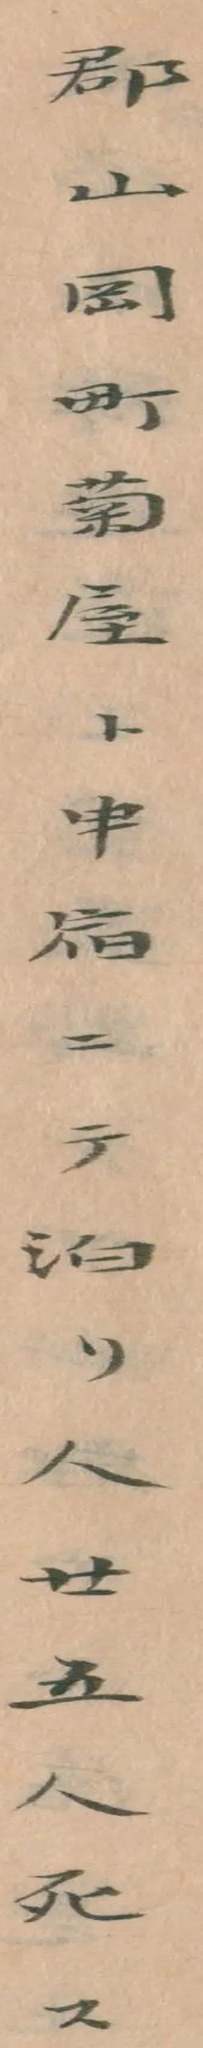一郡山岡町菊屋ト申宿ニテ泊り人廿五人死ス
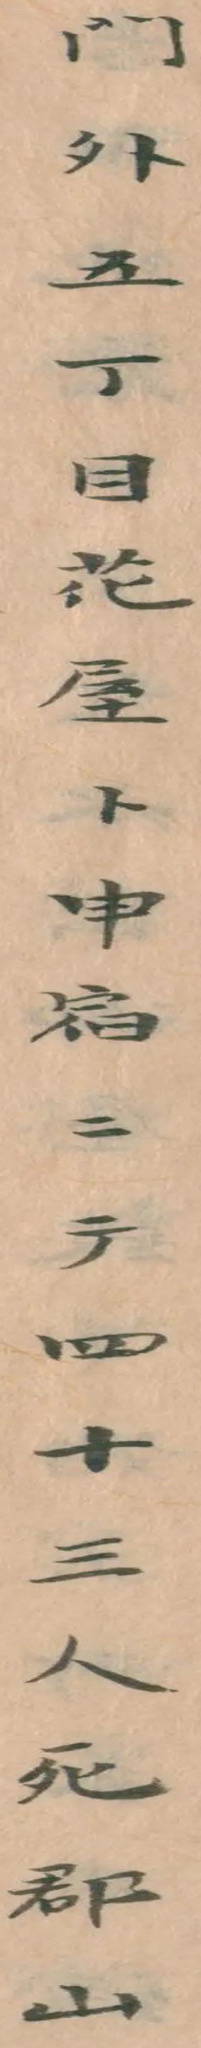門外五丁目花屋ト申宿ニテ四十三人死郡山
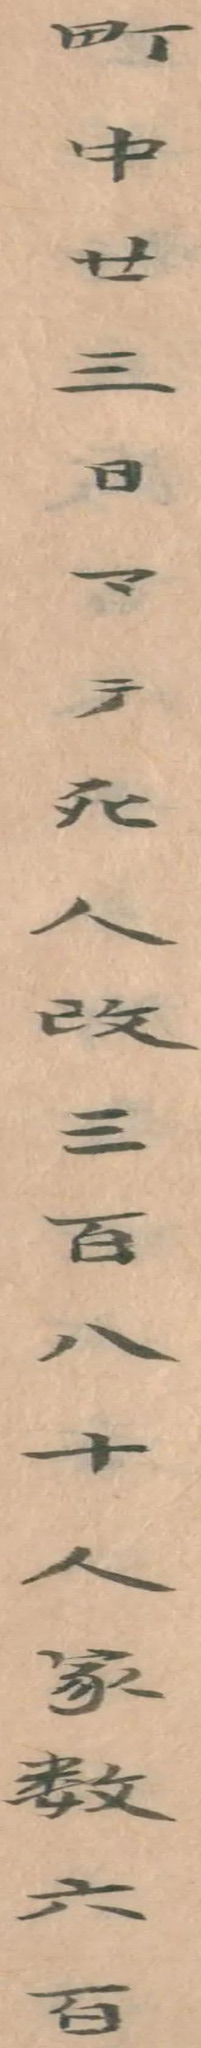町中廿三日マテ死人改三百八十人家数六百

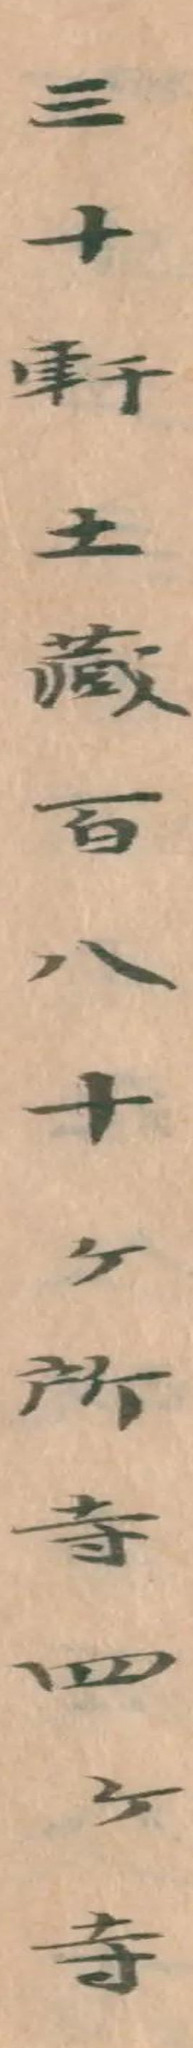三十軒土蔵百八十ヶ所寺四ヶ寺
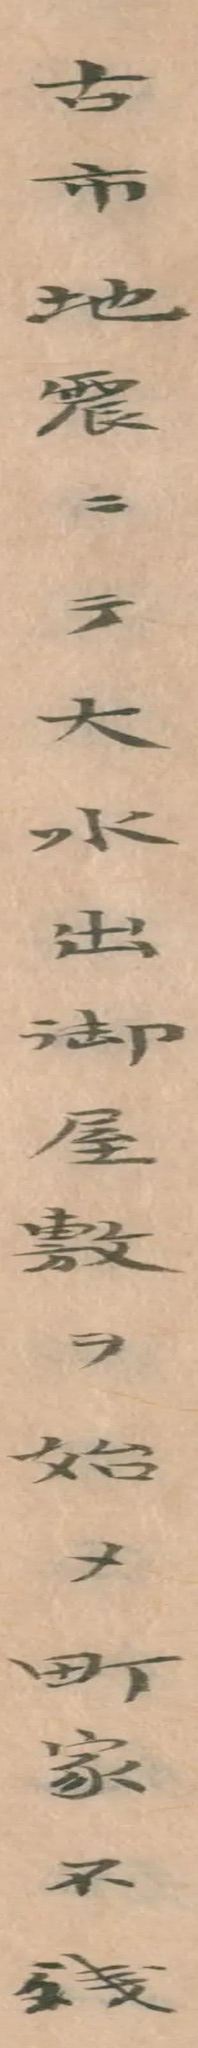一古市地震ニテ大水出御屋敷ヲ始メ町家不残
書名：地災撮要. 巻1(噴火山・地震ノ部)
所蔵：国立国会図書館 National Diet Library, JAPAN
